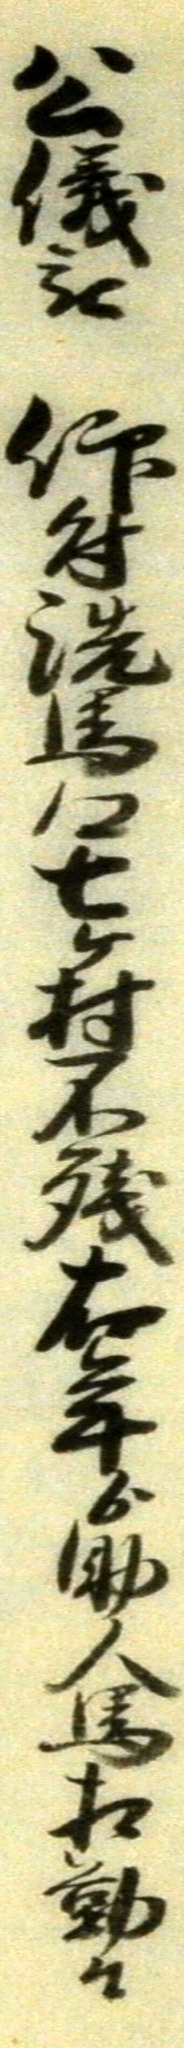公儀被仰付洗馬郷七ヶ村不残右年ゟ助人馬相勤候
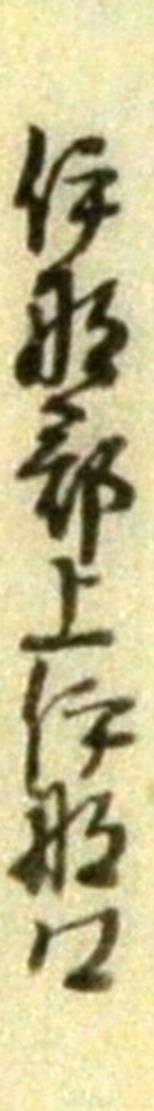伊那郡上伊那郷
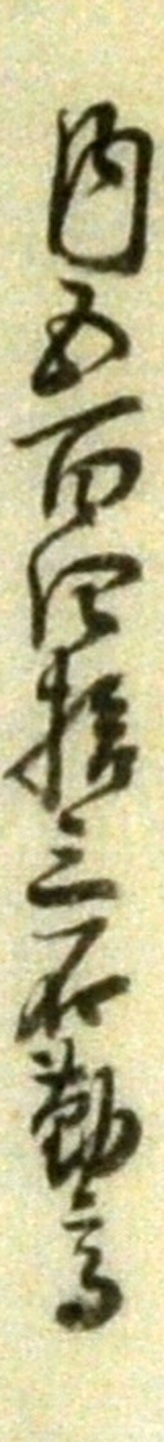内五百四拾参石勤高
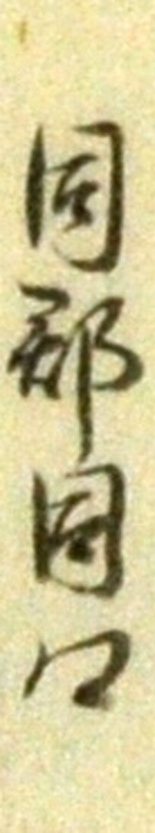同郡同郷
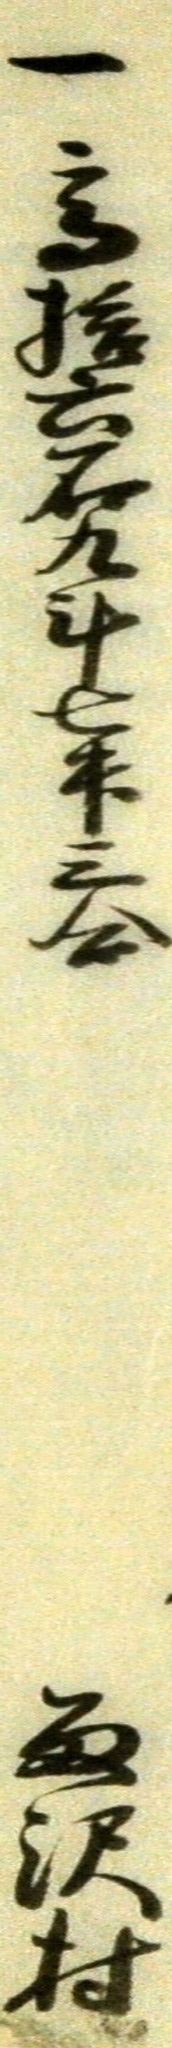一高拾六石九斗七升三合西沢村
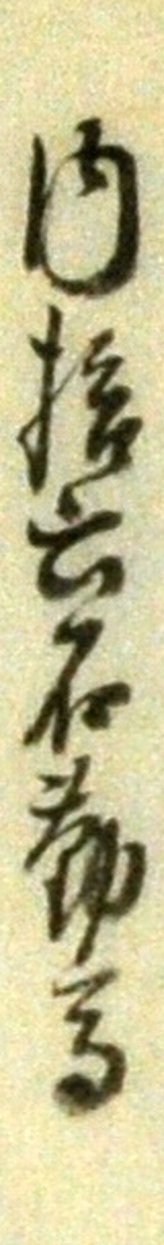内拾六石勤高
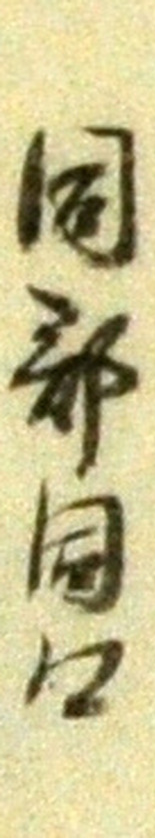同郡同郷
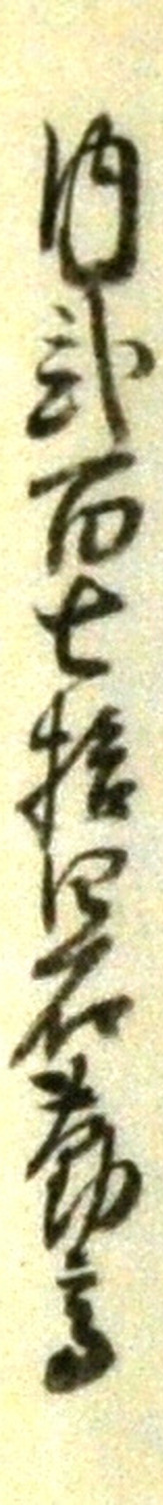内弐百七拾四石勤高

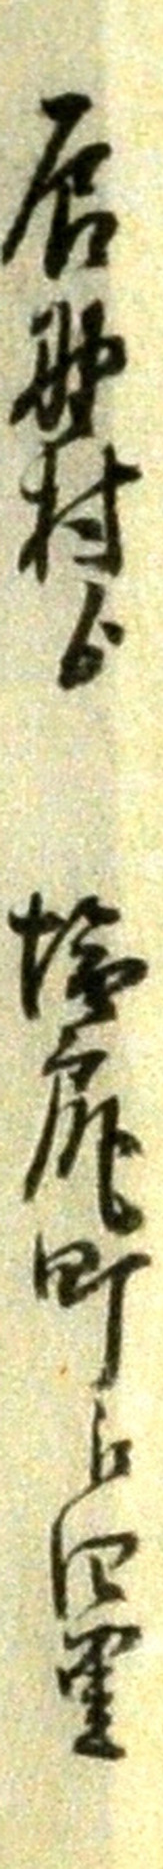辰野村ゟ塩尻町江四里
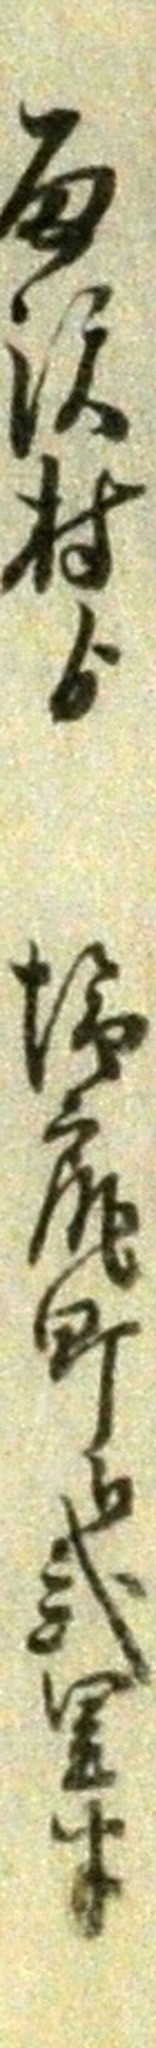西沢村ゟ塩尻町江弐里半
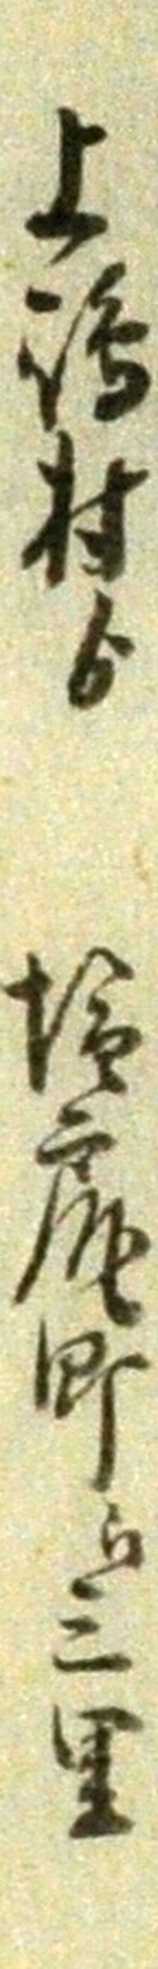上嶋村ゟ塩尻町江三里
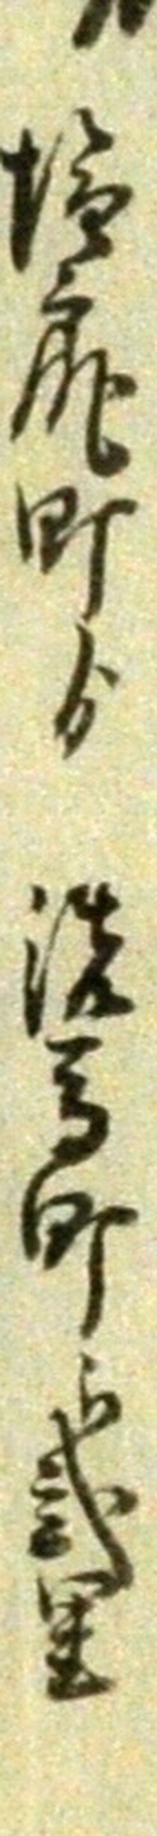塩尻町ゟ洗馬町江弐里
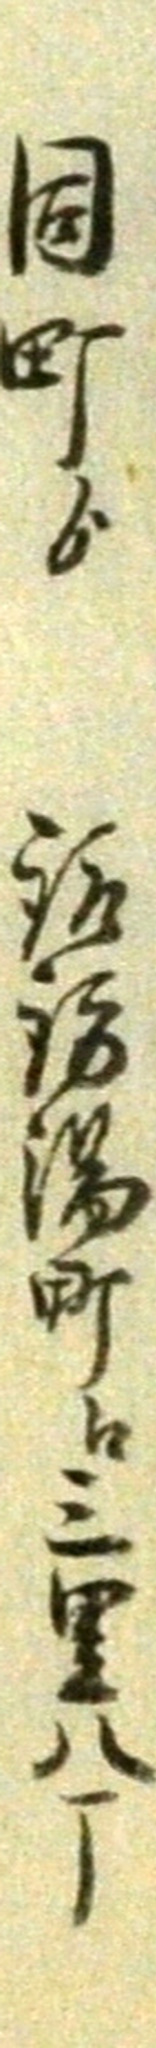同町ゟ諏訪湯町江三里八丁
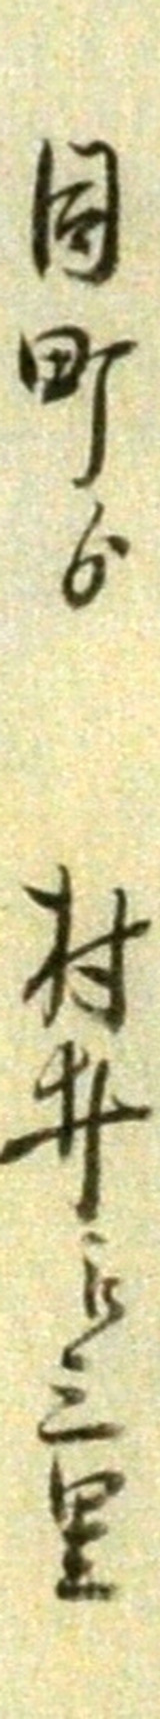同町ゟ村井江三里
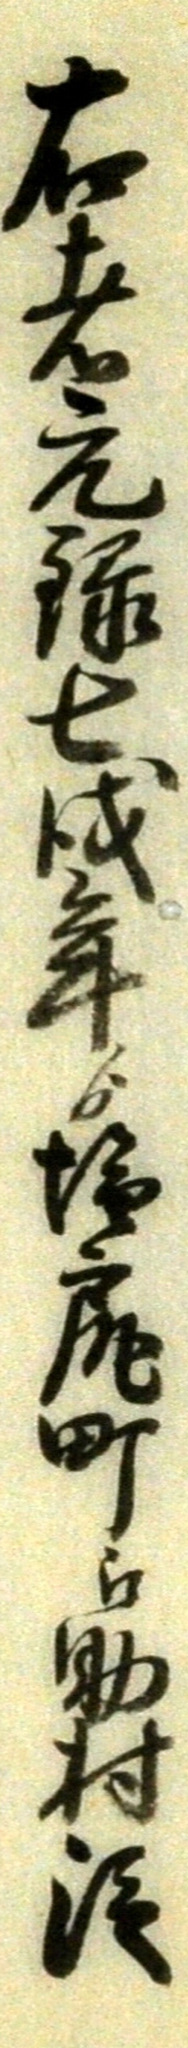右者元禄七戌年ゟ塩尻町江助村従
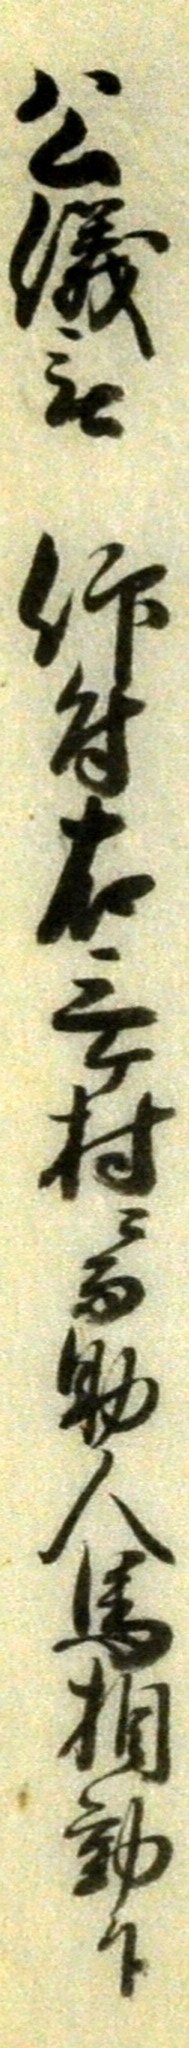公儀被仰付右三ヶ村ニ而助人馬相勤候
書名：御領分拾九箇村木曽助并塩尻町・洗馬町・本山町へ人馬勤覚帳
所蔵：伊那市立高遠町図書館・合同会社AMANE
